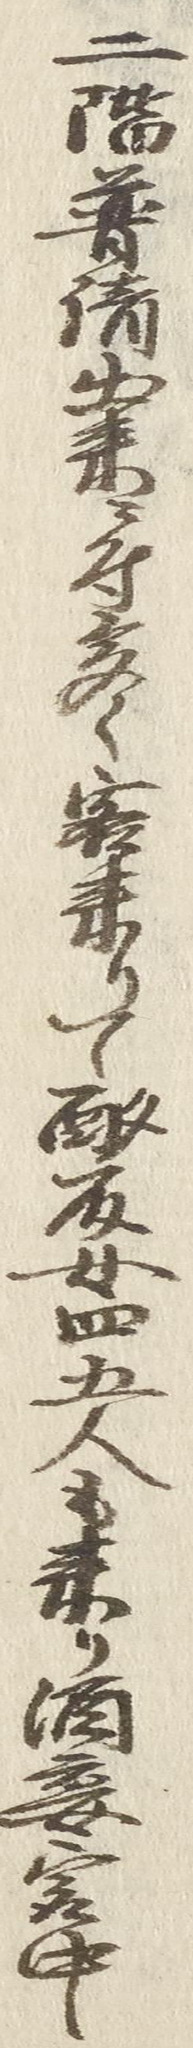二階普請出来ニ付多く客来りて酌取女四五人も来り酒宴最中
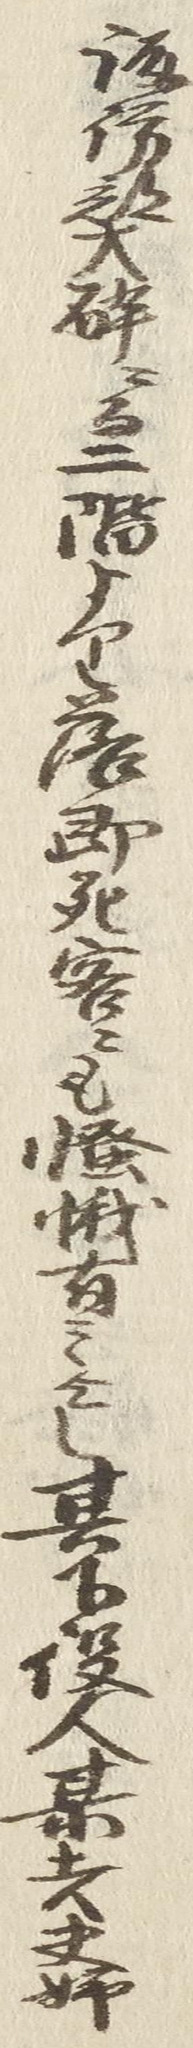諏訪部大砕ニ而二階より落即死客ニも怪我有之よし其下役人某は夫婦
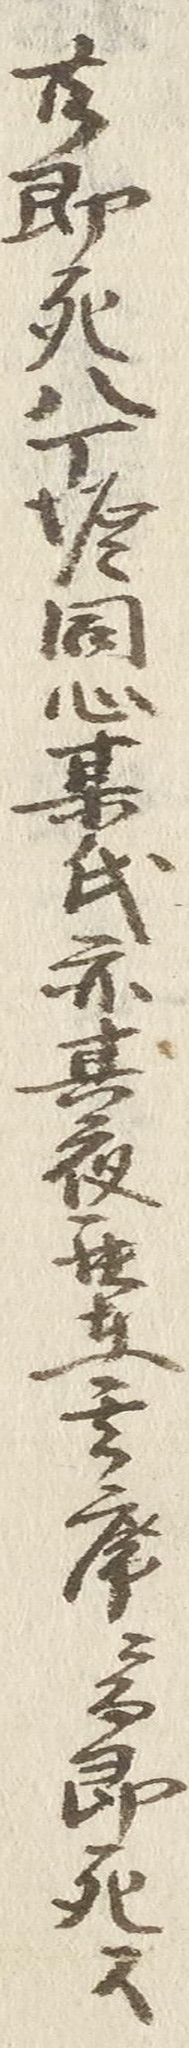共即死八丁堀同心某氏亦其夜罷在其席ニ而即死ス
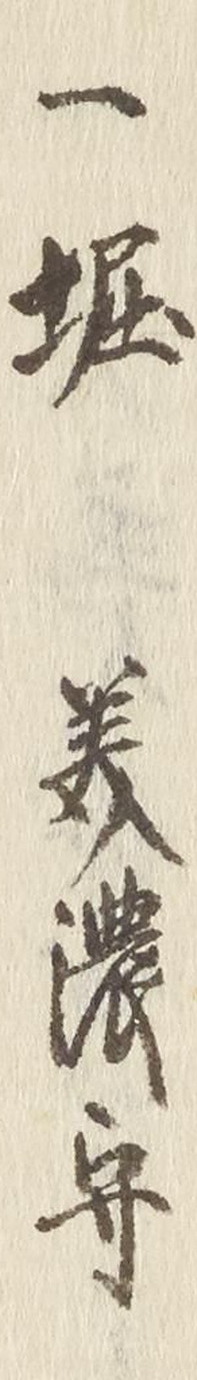一堀美濃守
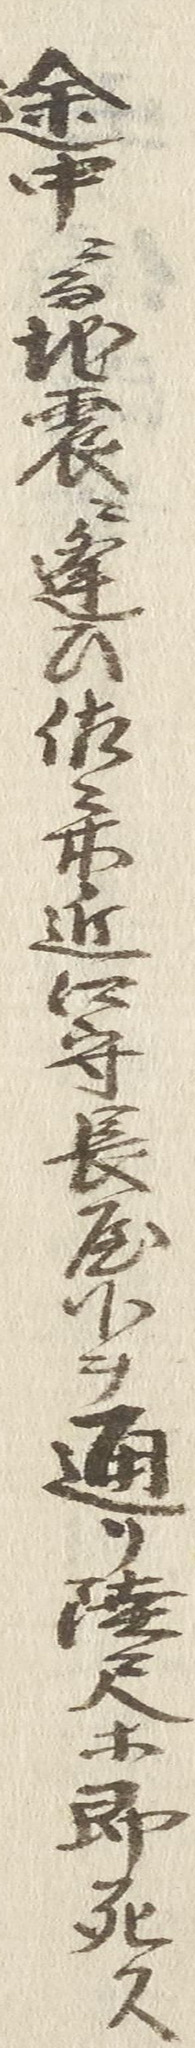途中ニ而地震ニ逢ひ佐々木近江守長屋下ヲ通り陸尺等即死ス
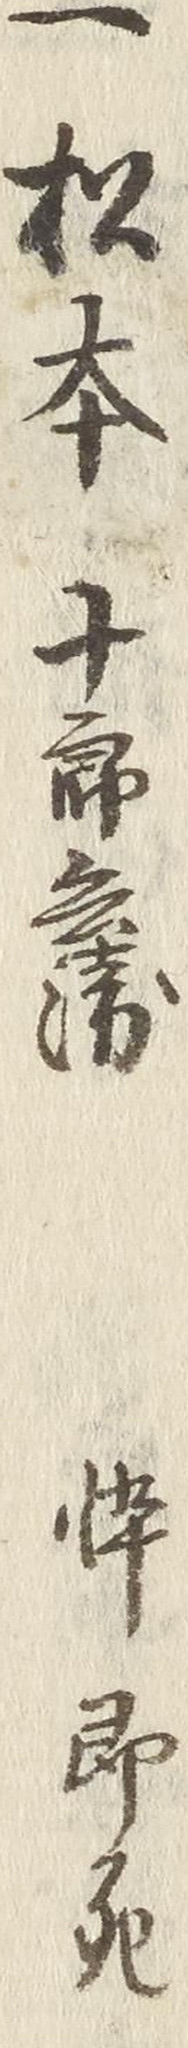一松本十郎兵衛忰即死
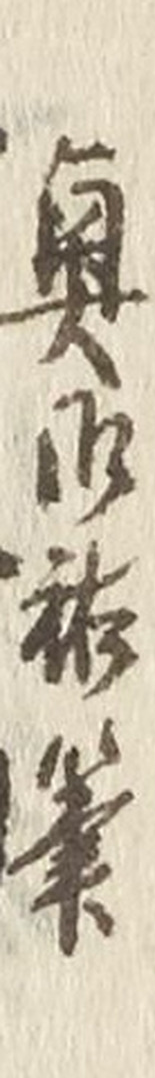奥御祐筆
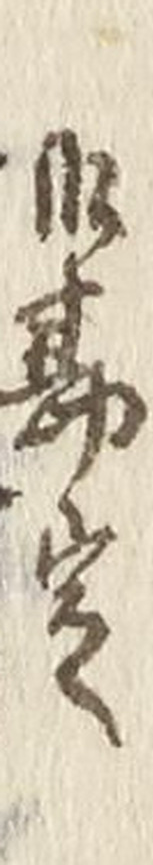御勘定
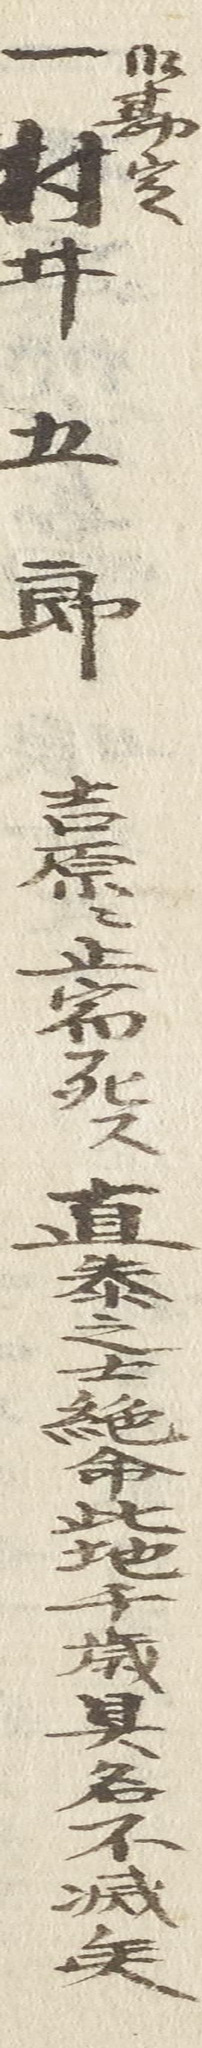一村井五郎吉原ニ止宿死ス直泰之士絶命此地千歳具名不滅矣
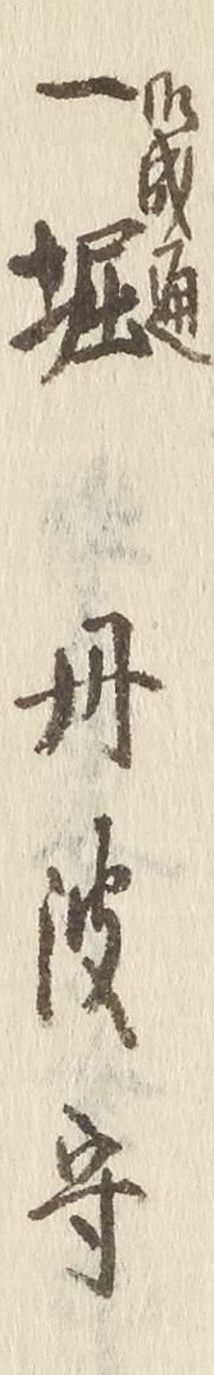一堀美濃守
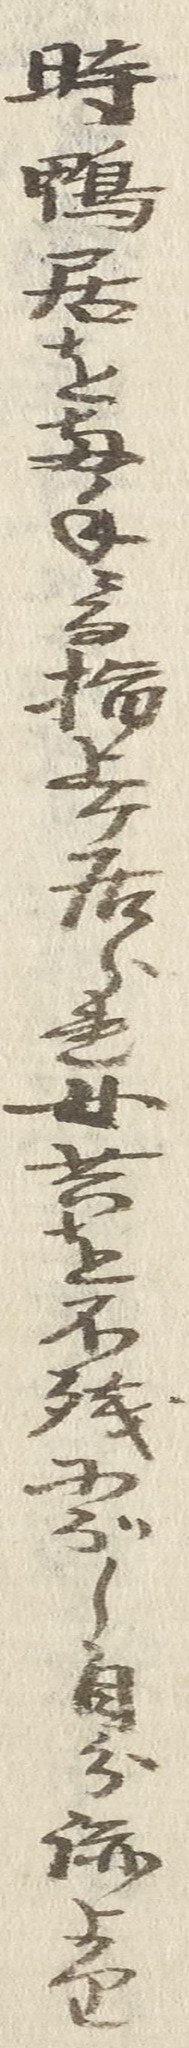時鴨居を両手ニ而指上ケ居られ女共を不残にがし自分跡より
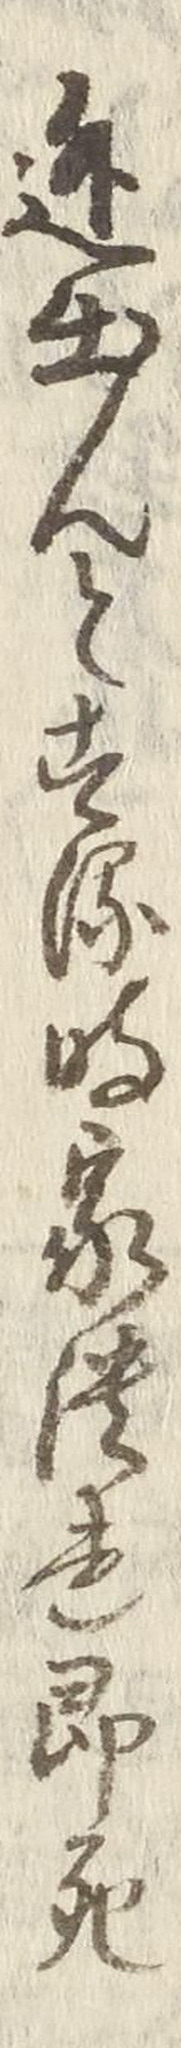逃出んとする時家潰れ即死

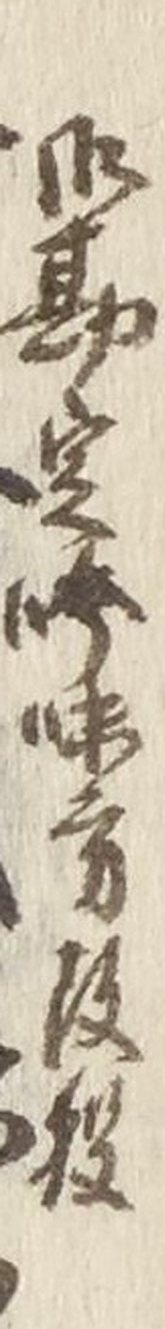御勘定吟味方改役
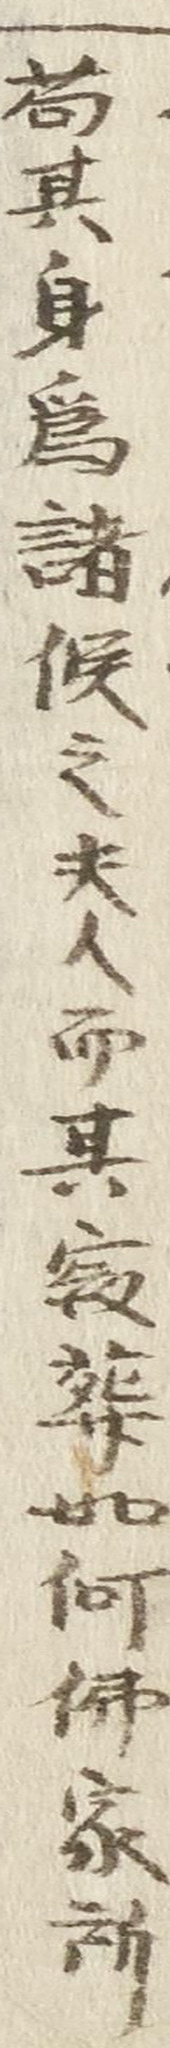苟其身為諸侯之夫人而其寂葬如何仏家所
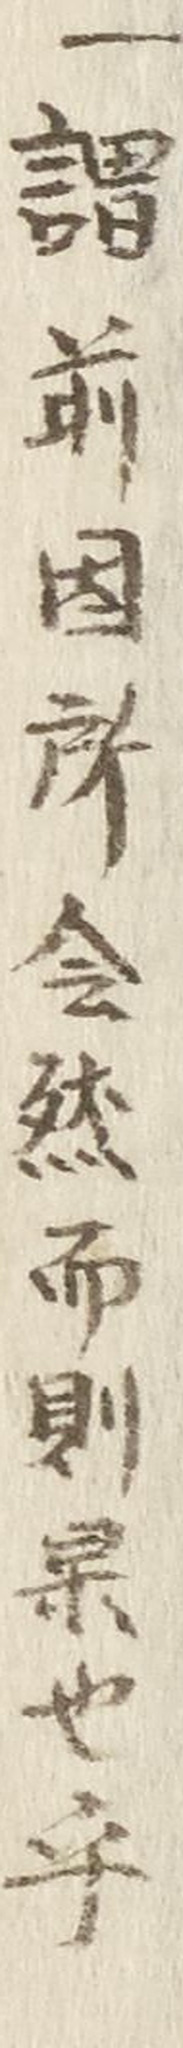謂前因所会然而則果也乎
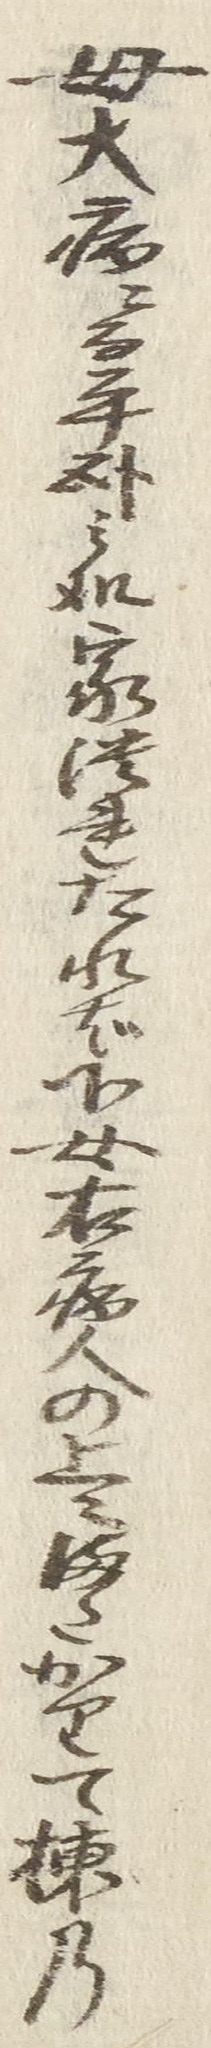母大病ニ而平臥之処家潰れたれば下女右病人の上ニまたかりて棟の
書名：従往古地震御届書記誌之一
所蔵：東京大学地震研究所図書室 Earthquake Research Institute Library, The University of Tokyo, JAPAN
